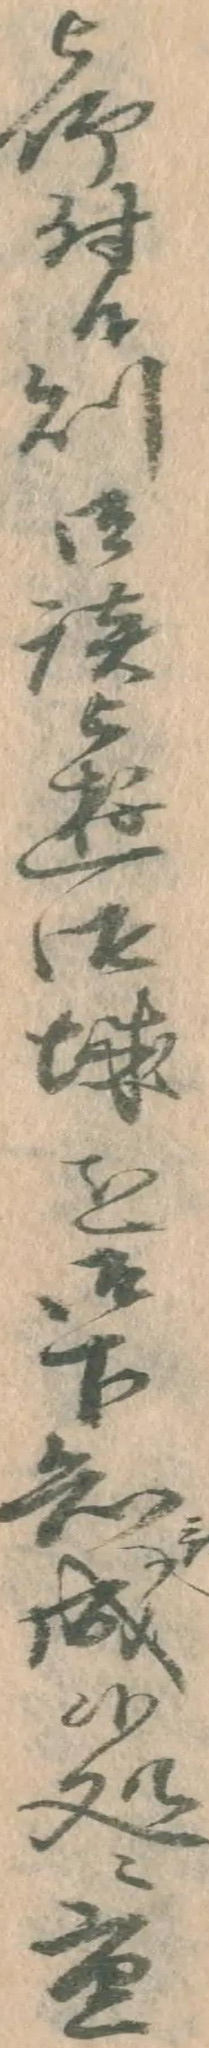被仰付候則御談被遊御城を御下知被成候処に重
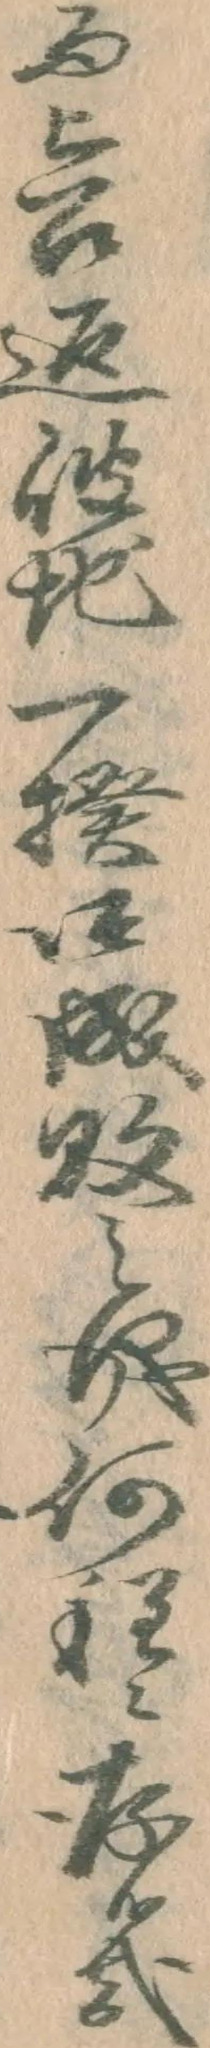而被召返彼地一揆御成敗之儀何程に存候哉
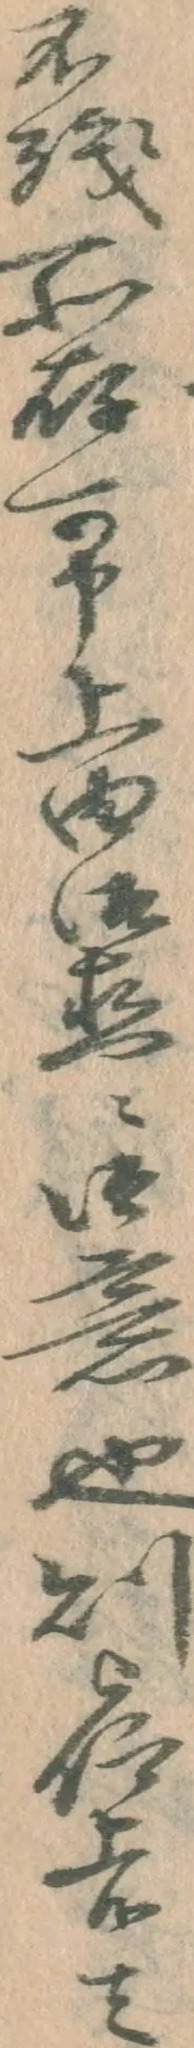不残所存可申上由御直に御意也則被仰上候者
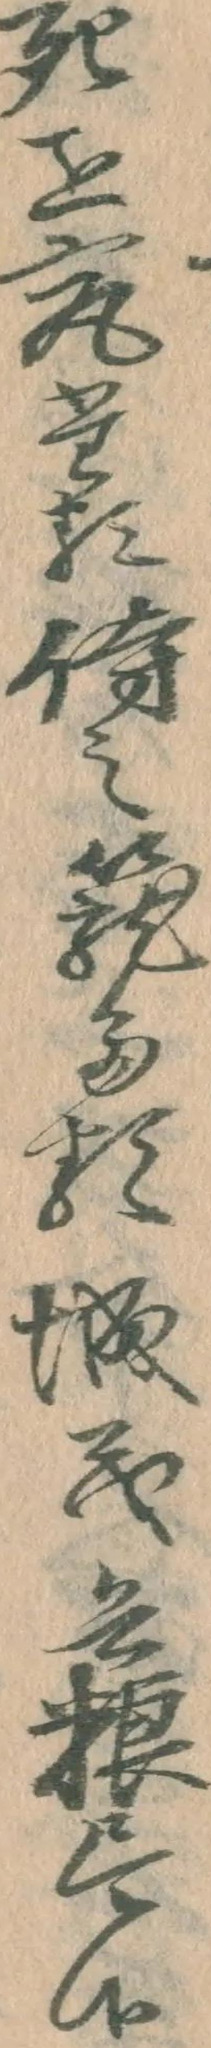死を究堂類侍之籠多類城茂兵粮尽候
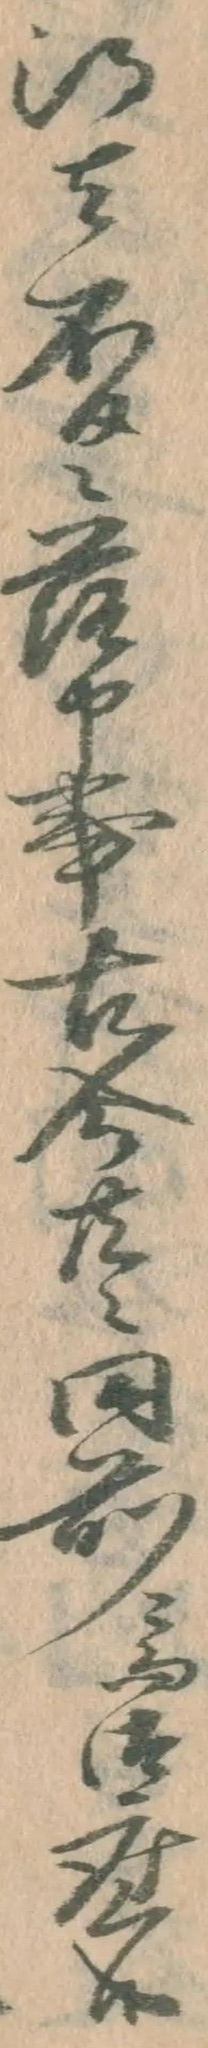得者不具落申事古今共に同前に而御座候
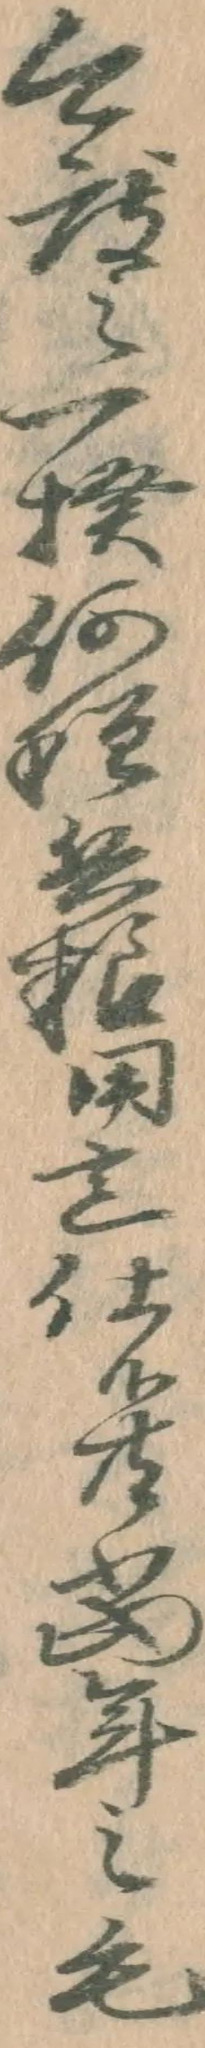今度之一揆何程兵粮用意仕候共当年之毛
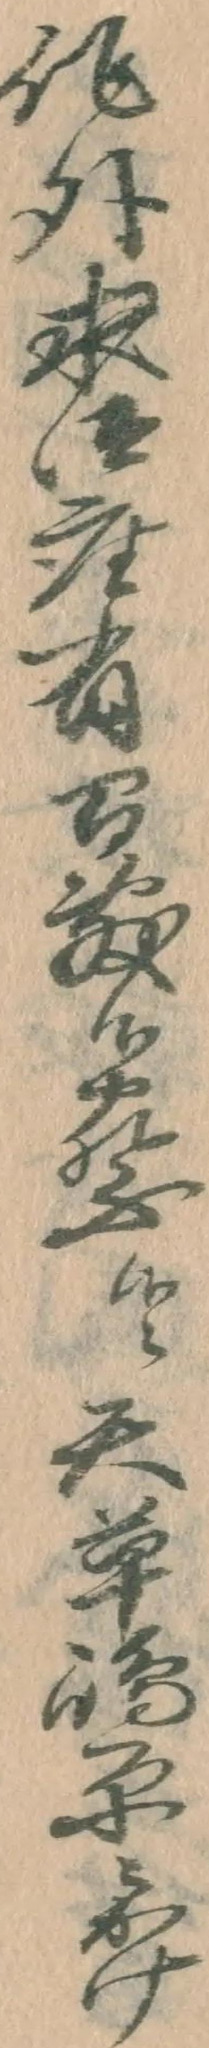作外求御座有間敷候察候に天草島原にかけ
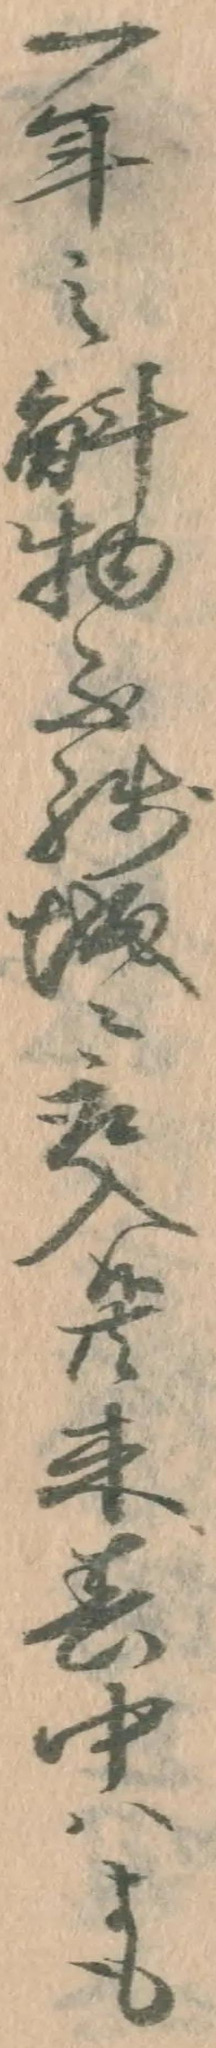一年之斛物ふ残城に取入候共来春中はよも
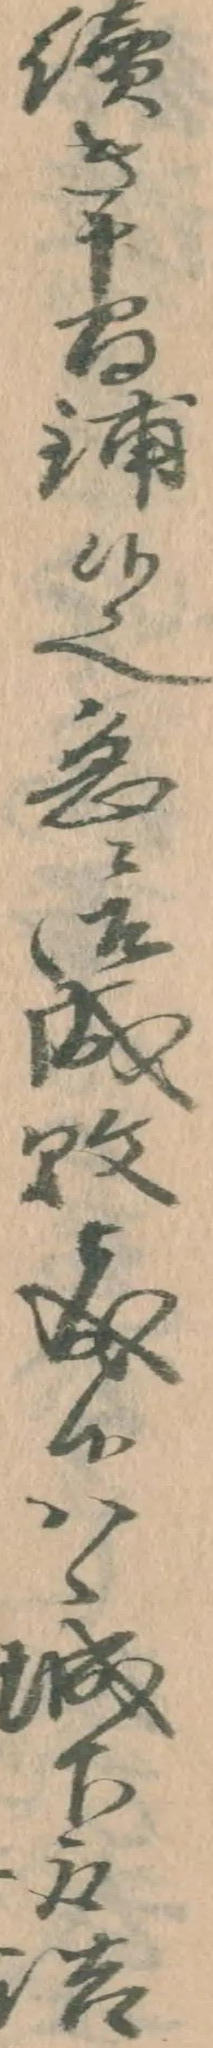続き申間鋪候也急に御成敗被成候はゝ城下取詰
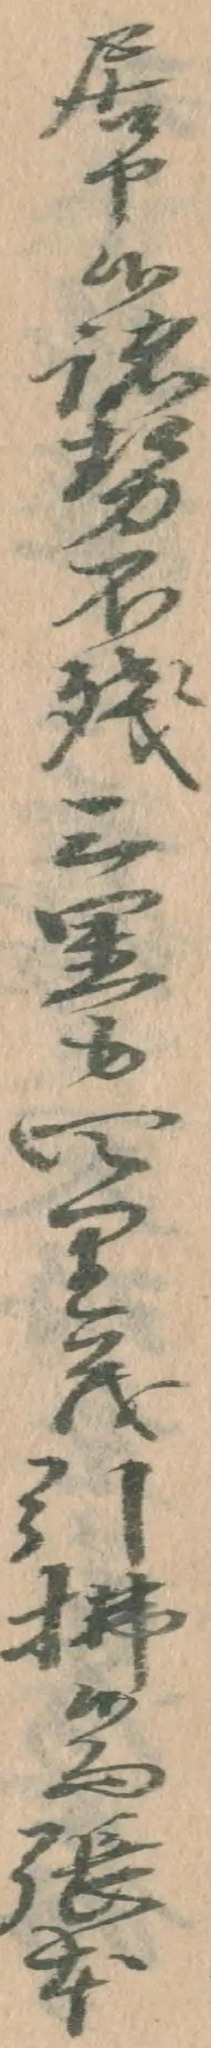居申候諸勢不残三里も四里茂引払候而張本
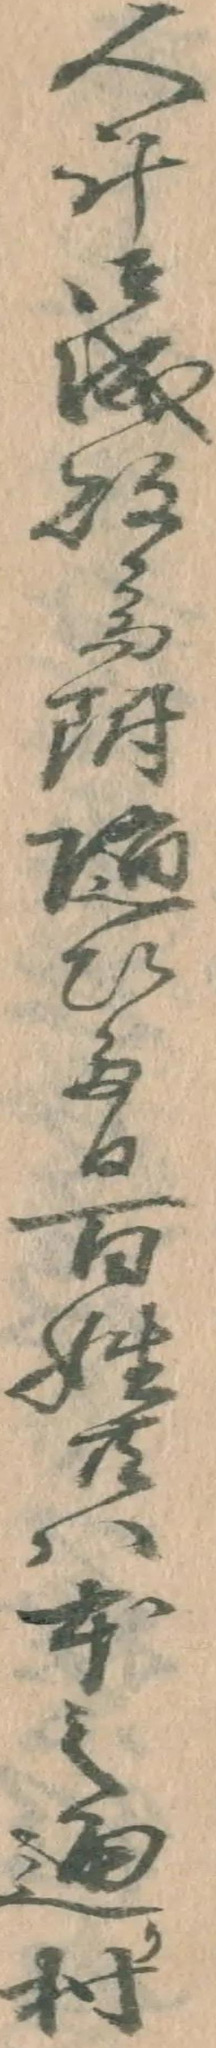人斗御成敗に而附随ひ多る百姓共は本之通り村
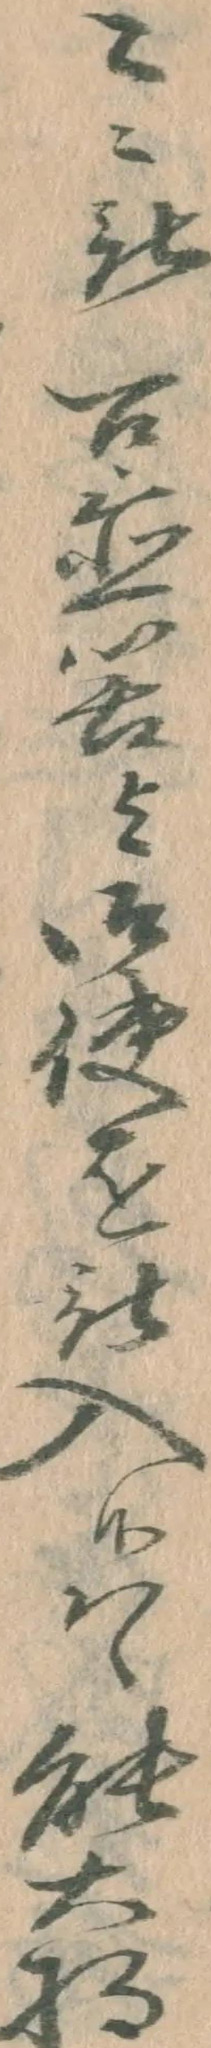々に被召置筈与御使を被入候はゝ能大将
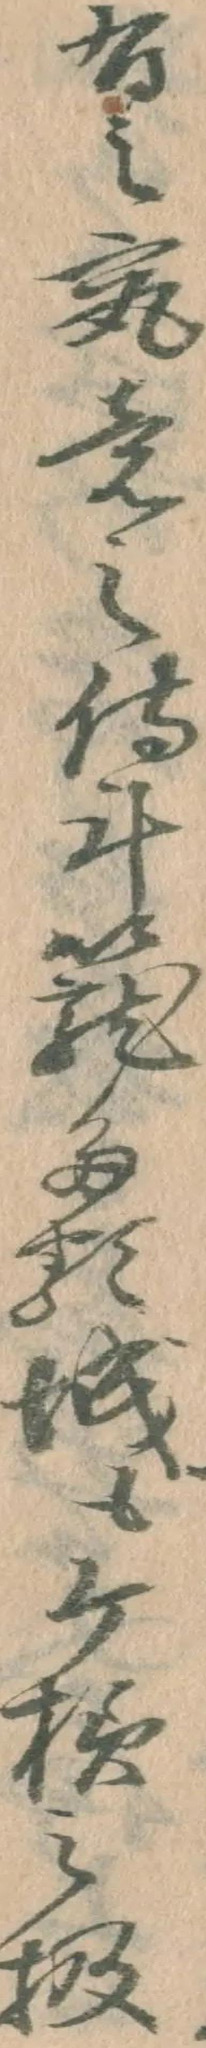有之究竟之侍斗籠多類城もけ様之扱
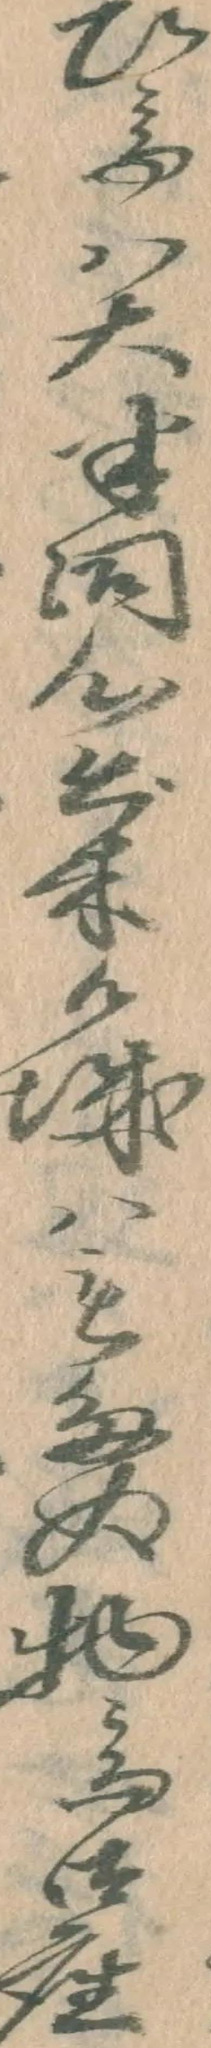ひに而は大半同心出来候城はも多ぬ物に而御座
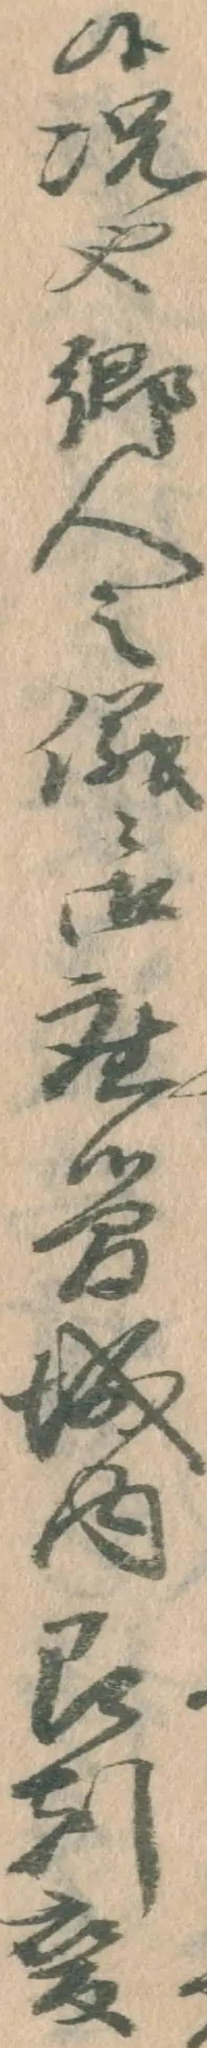候況や郷人之儀に御座候間城内即刻変
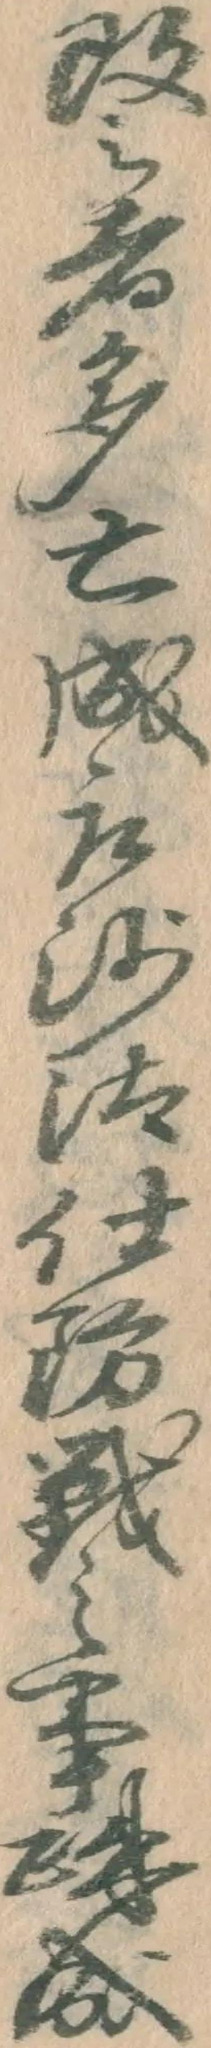改之者多亡成取沙汰仕防戦之事疎成
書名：切支丹御退治記 49巻. [4]
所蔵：国立国会図書館 National Diet Library, JAPAN
